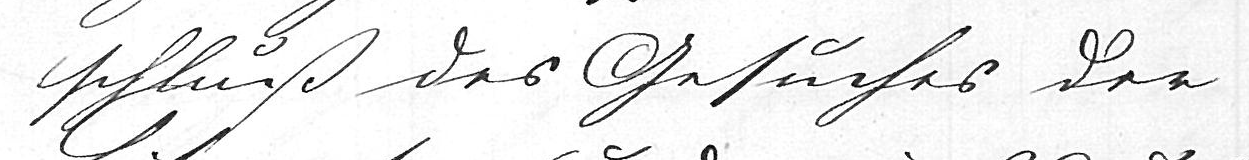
schluß des Gesuches der
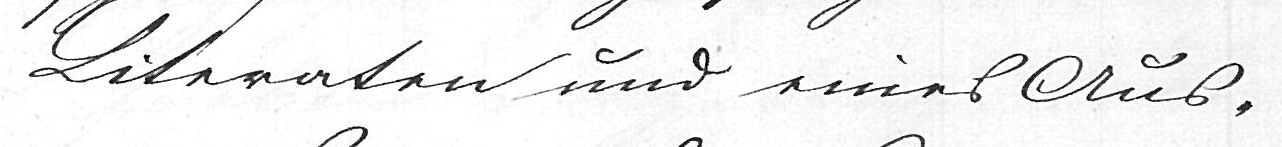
Literaten und eines Aus-
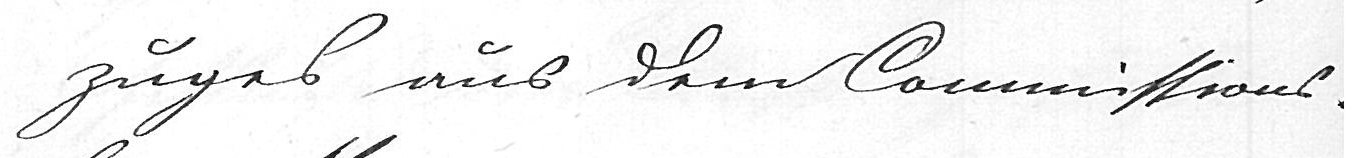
zuges aus dem Commissions-
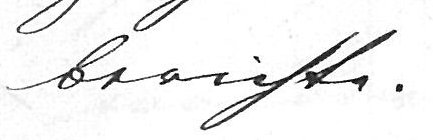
berichte.
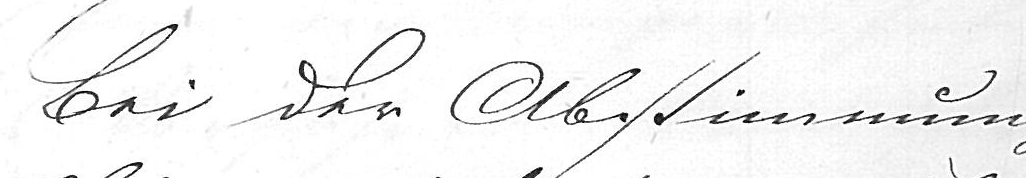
Bei der Abstimmung
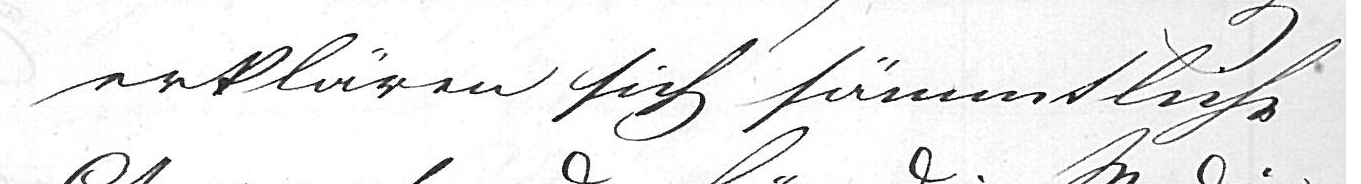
erklären sich sämmtliche
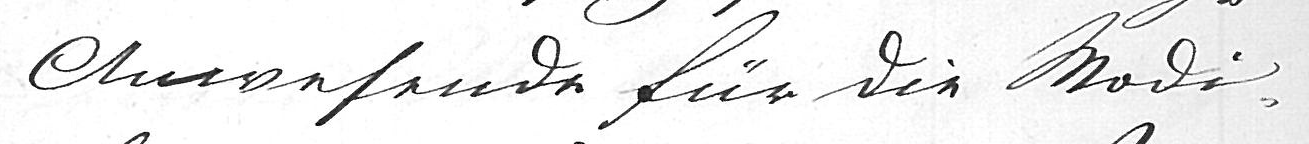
Anwesende für die Modi-
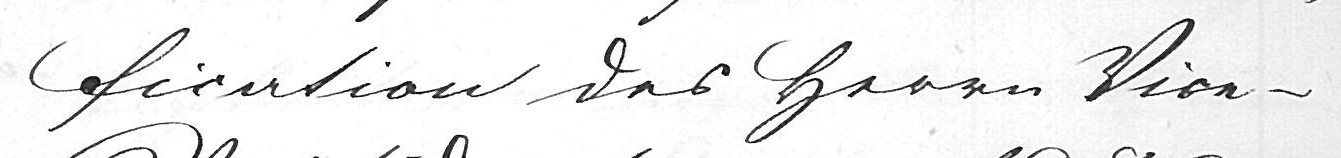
fication des Herrn Vice-
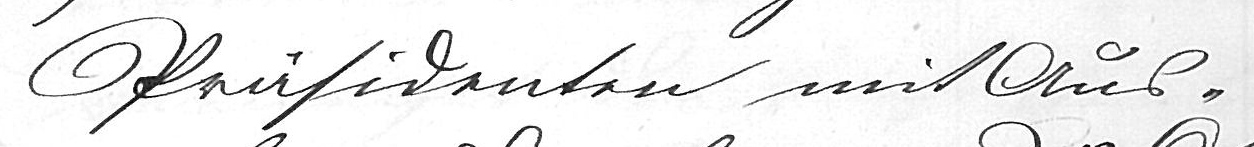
Präsidenten mit Aus-
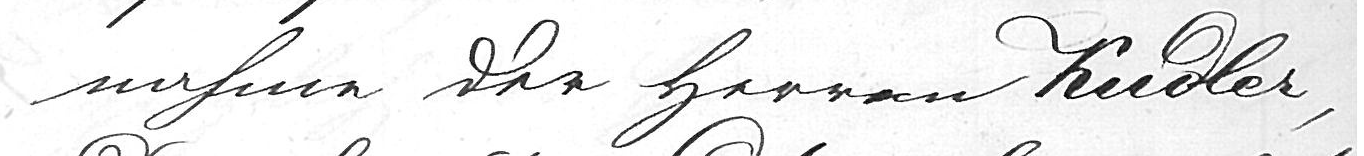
nahme der Herren Kudler,
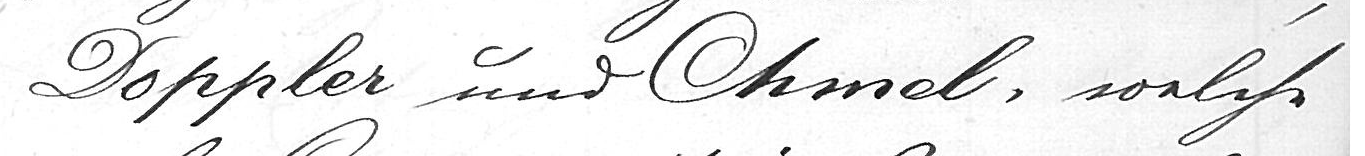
Doppler und Chmel, welche
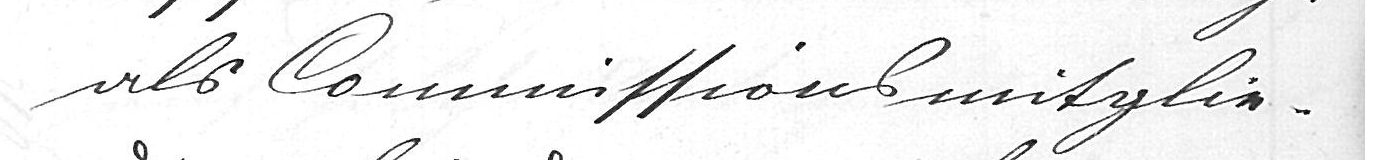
als Commissionsmitglie-
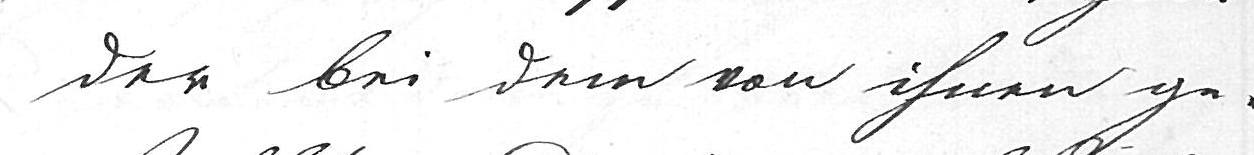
der bei dem von ihnen ge-
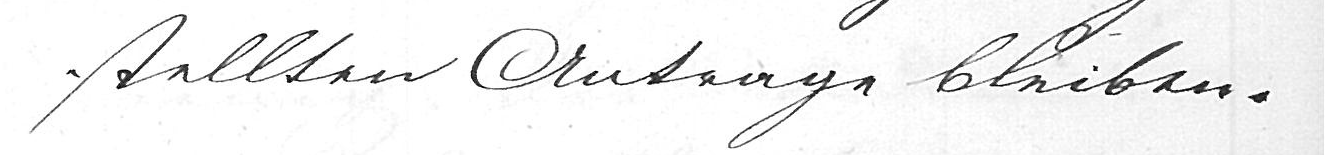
stellten Antrage bleiben.
